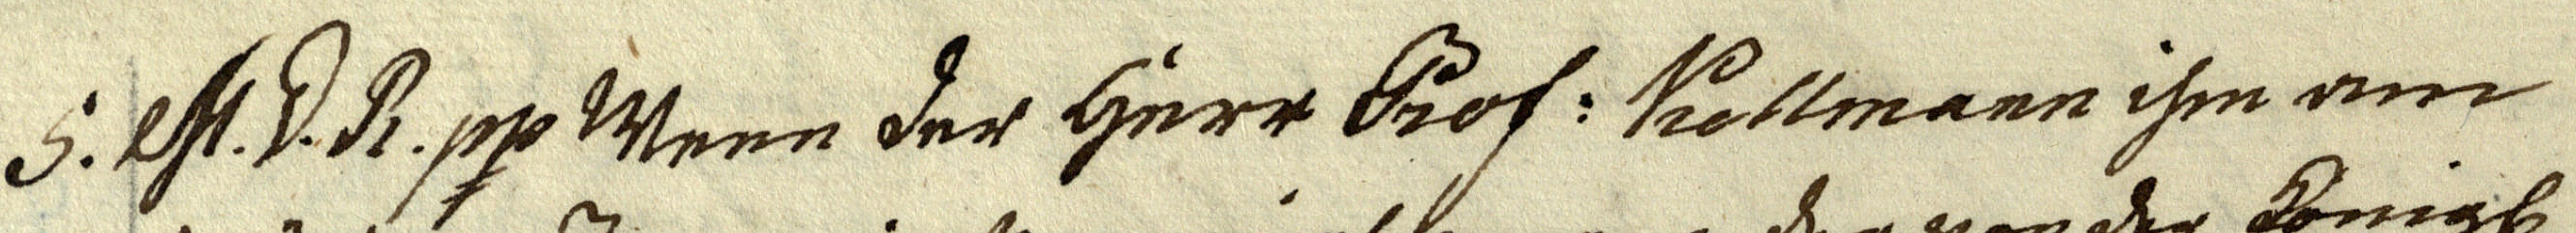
5. M. D. RR. pp Wenn der Herr Prof. Kellmann ihm am
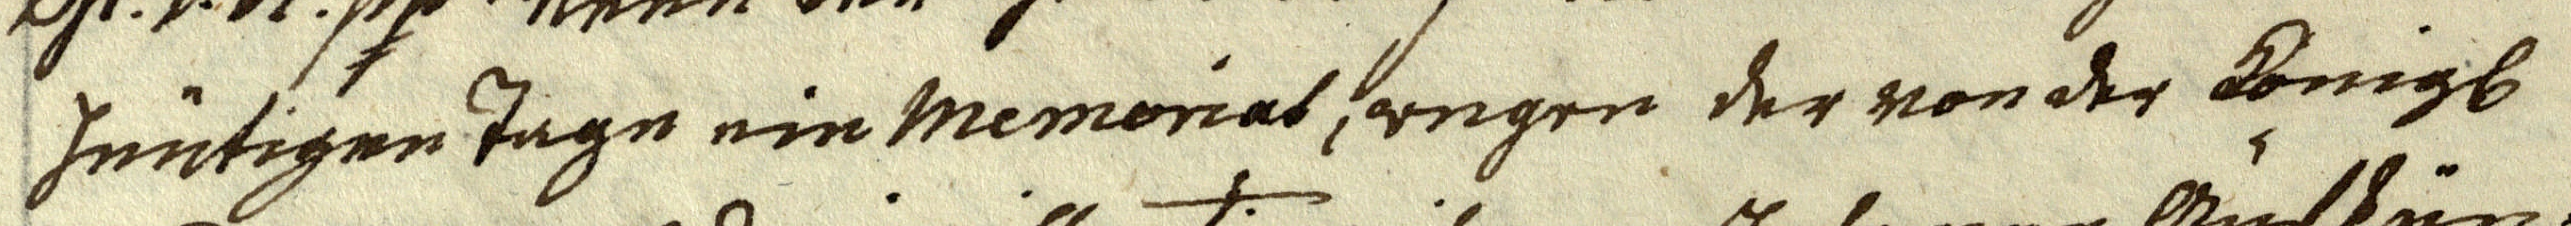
heutigen Tage ein Memorial, wegen der von der Königl.
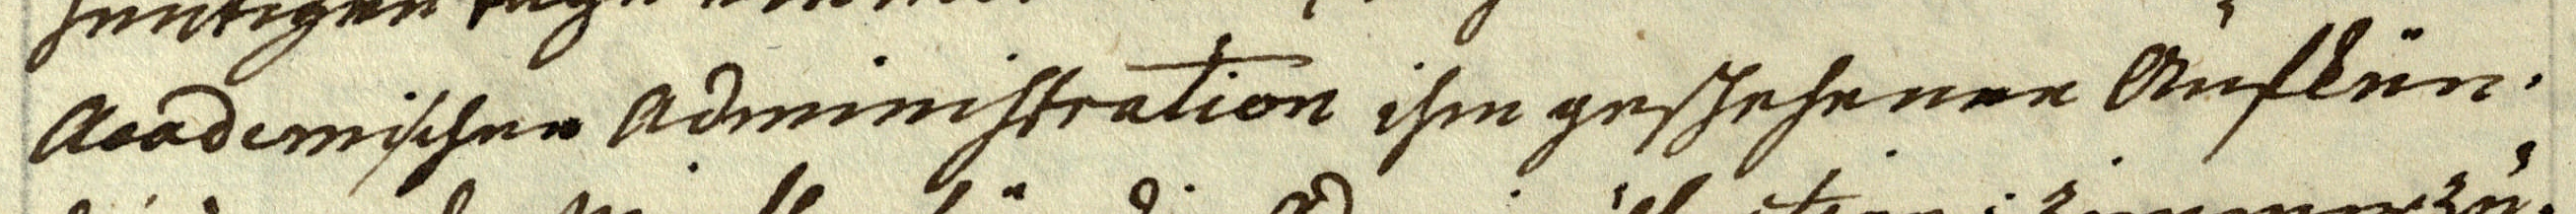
Academischen Administration ihm geschehenen Aufkün¬
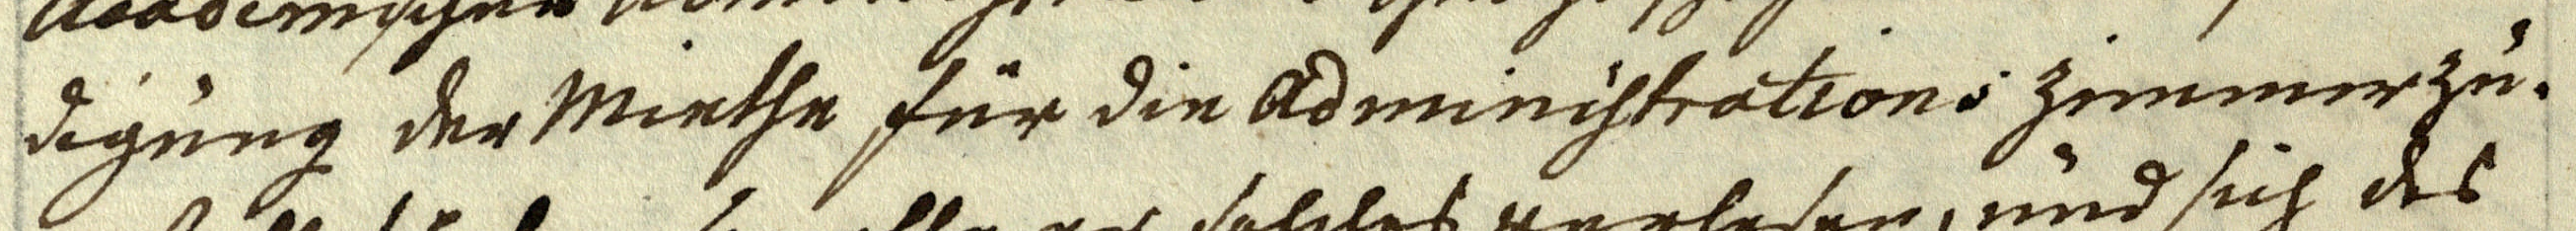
digung der Miethe für die Administrations zimmer zu¬
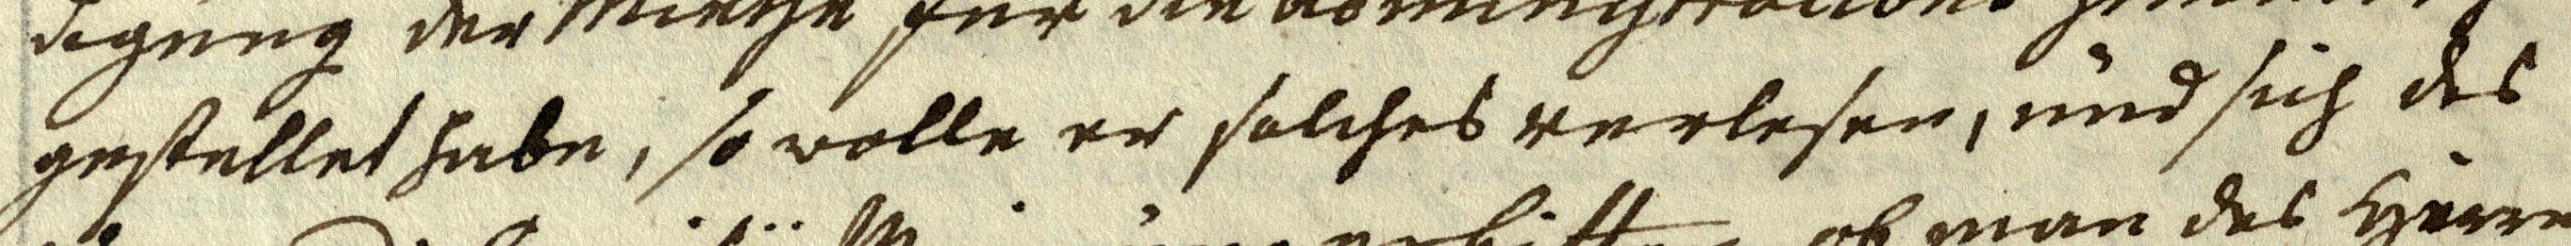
gestellet habe, so wolle er solches verlesen, und sich des
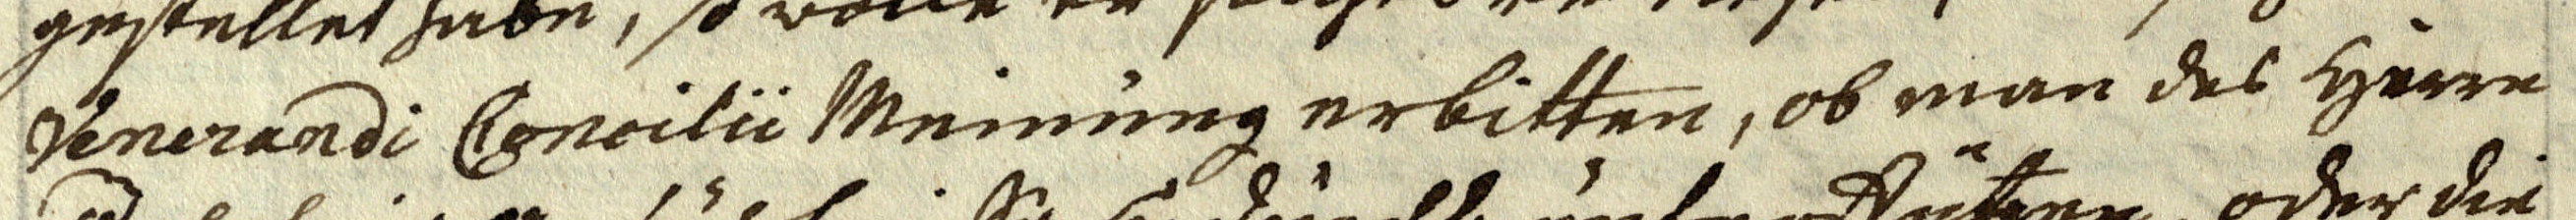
Venerandi Concilii Meinung erbitten, ob man des Herrn
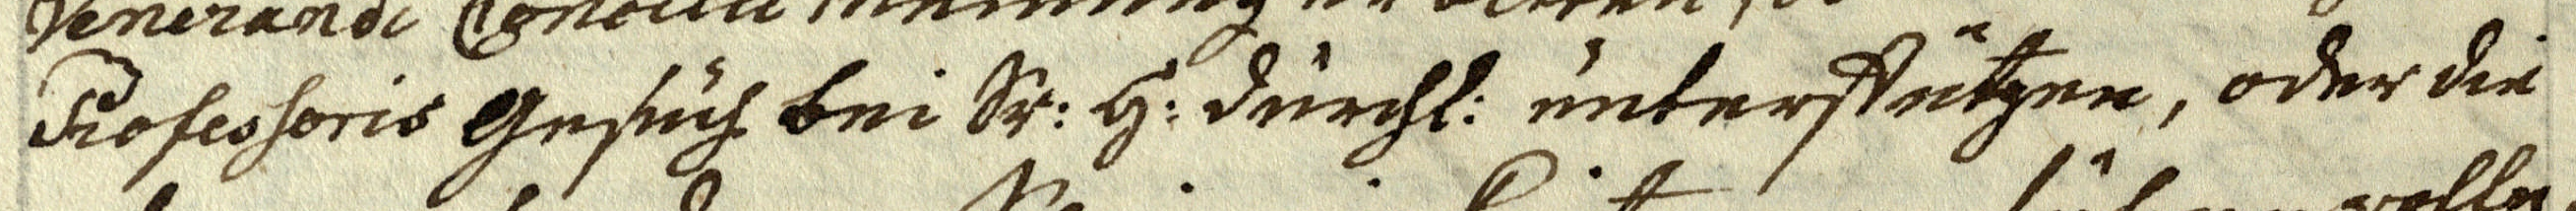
Professoris Gesuch bei Sr. H. Durchl. unterstützen, oder die
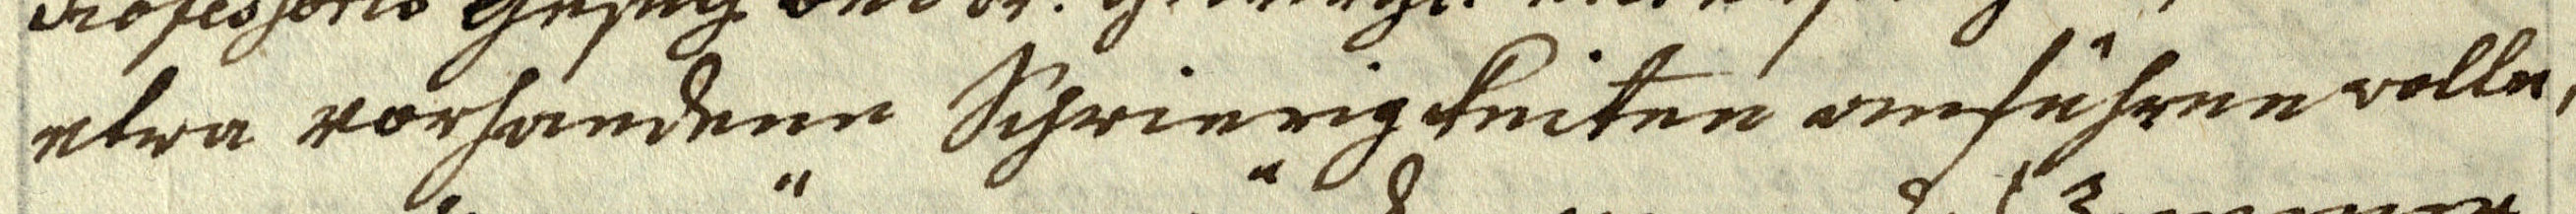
etwa vorhandenen Schwierigkeiten anführen wolle,
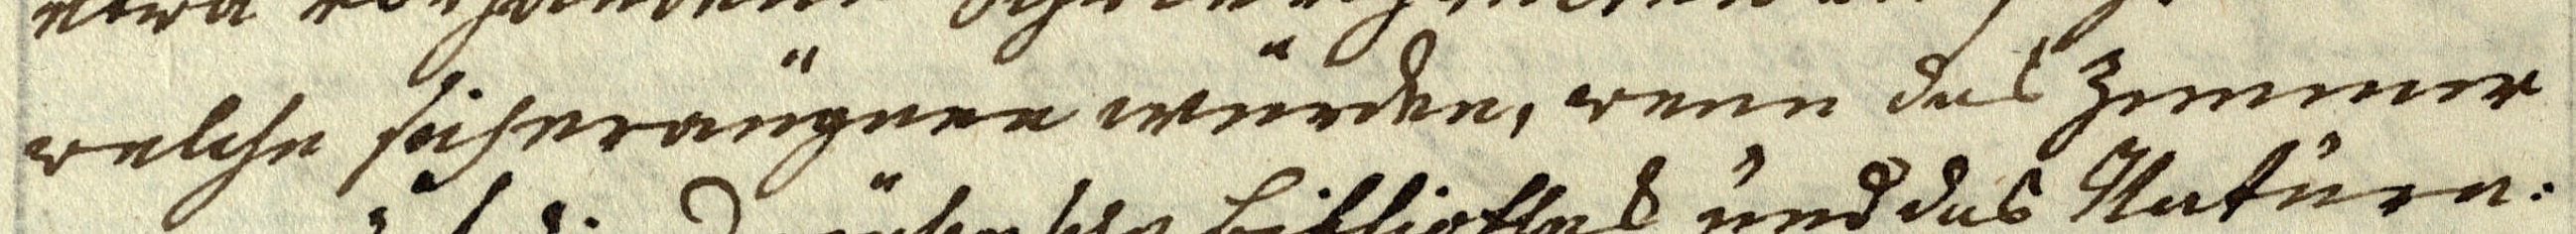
welche sich eräugnen würden, wenn das Zimmer
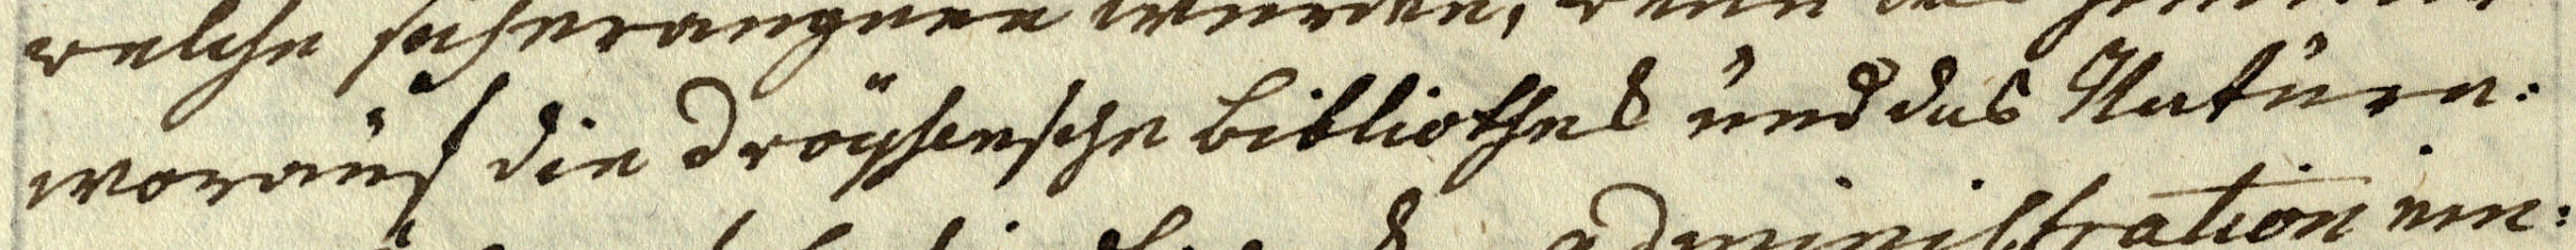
worauf die droÿsensche Bibliothek und das Natura¬
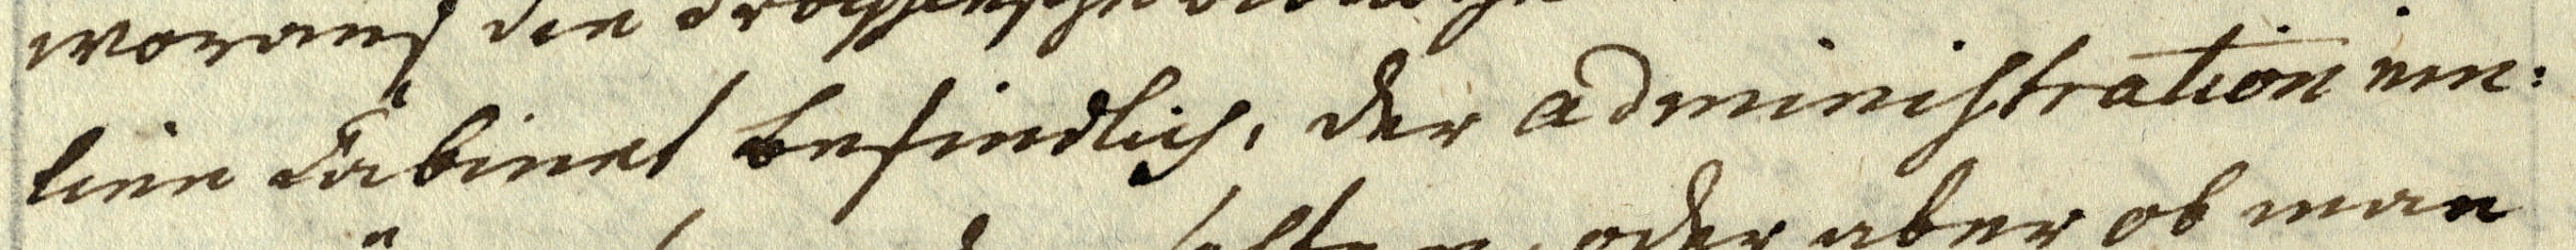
lien Cabinet befindlich, der Administration ein¬
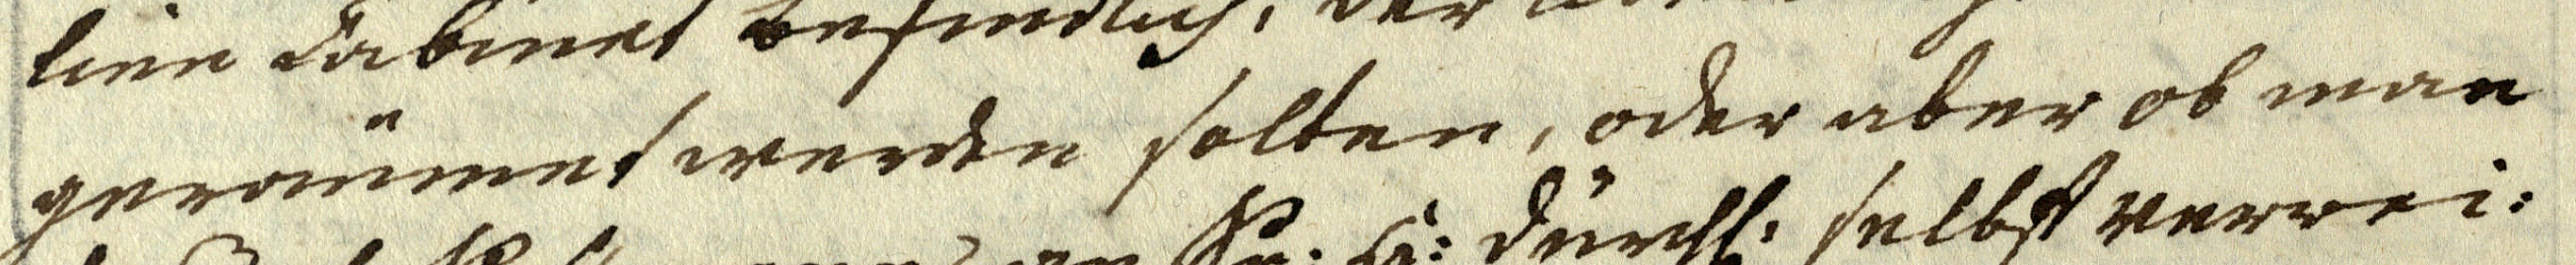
geräumet werden solten, oder aber ob man
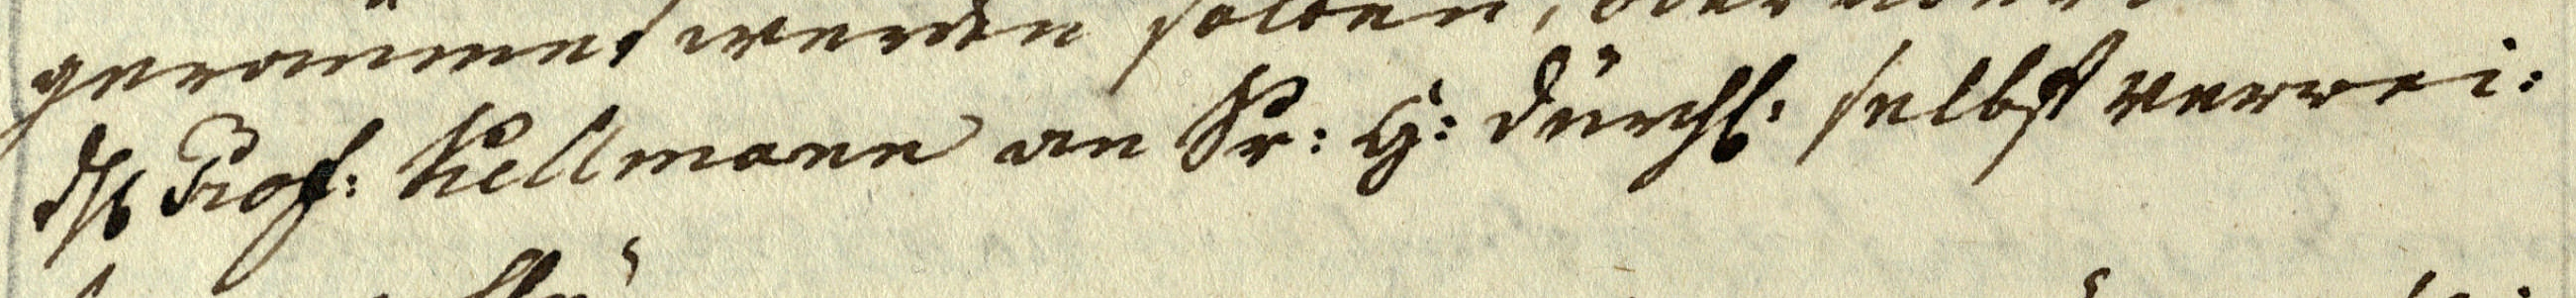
dh. Prof. Kellmann an Sr. H. Durchl. selbst verwei¬
